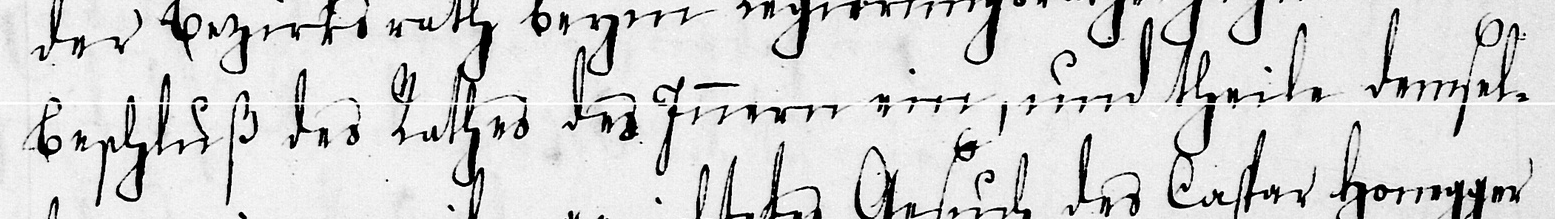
Beschluß des Rathes des Innern ein, und theile demsel¬
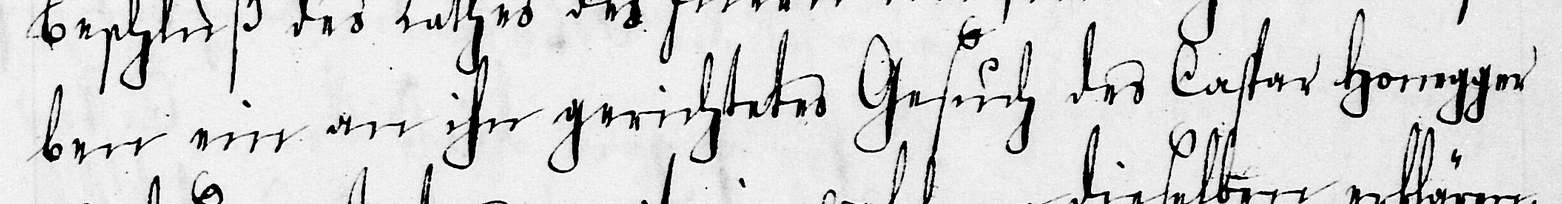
ben ein an ihn gerichtetes Gesuch des Caspar Honegger
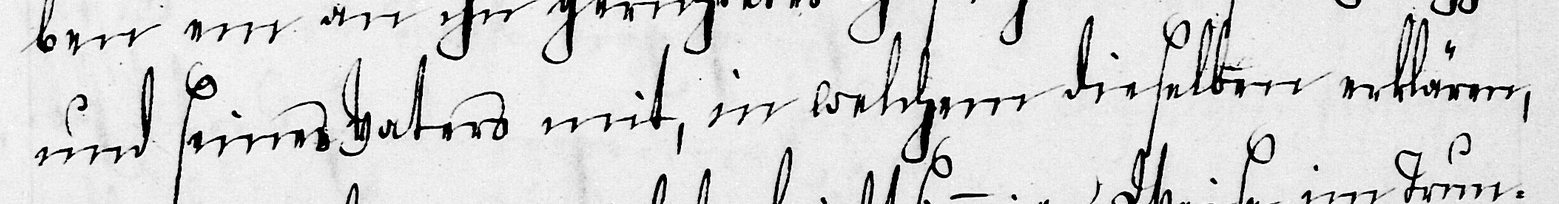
und seines Vaters mit, in welchem dieselben erklären,
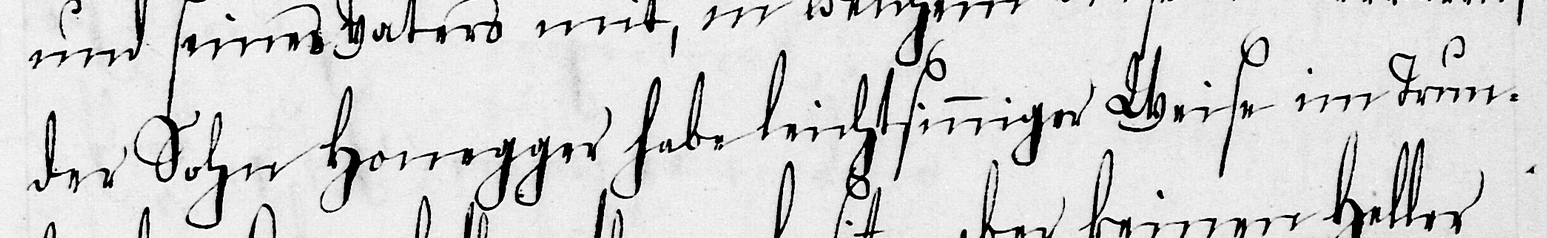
der Sohn Honegger habe leichtsinniger Weise im Trun¬
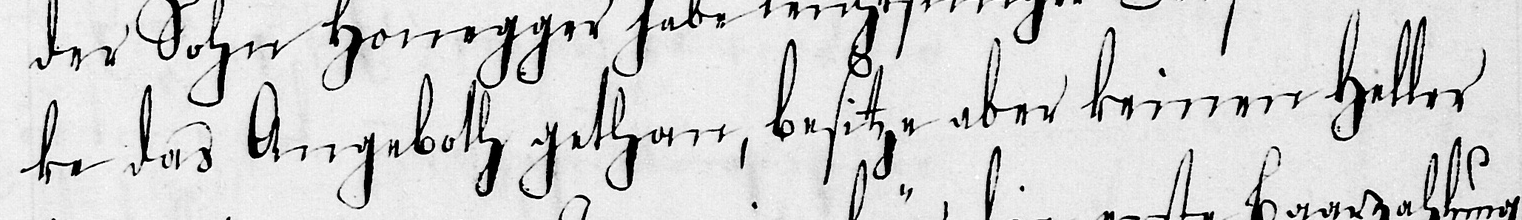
ke das Angeboth gethan, besitze aber keinen Heller
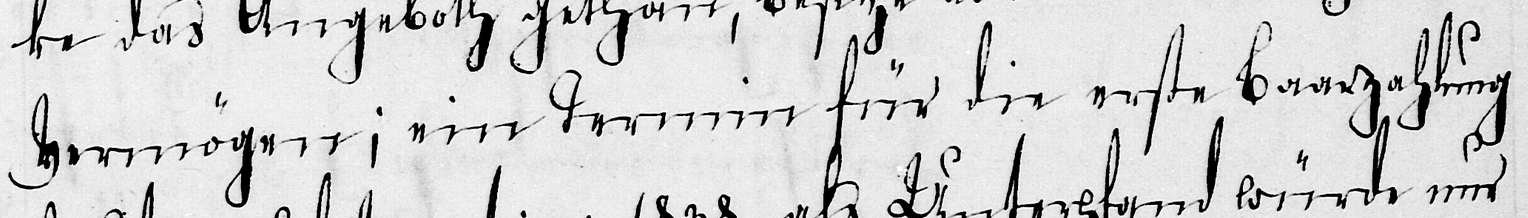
Vermögen; ein Termin für die erste Baarzahlung
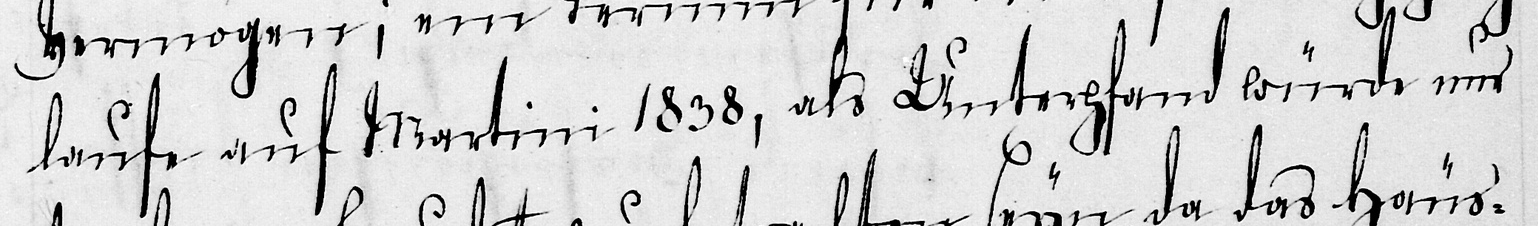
laufe auf Martini 1838, als Unterpfand würde nur
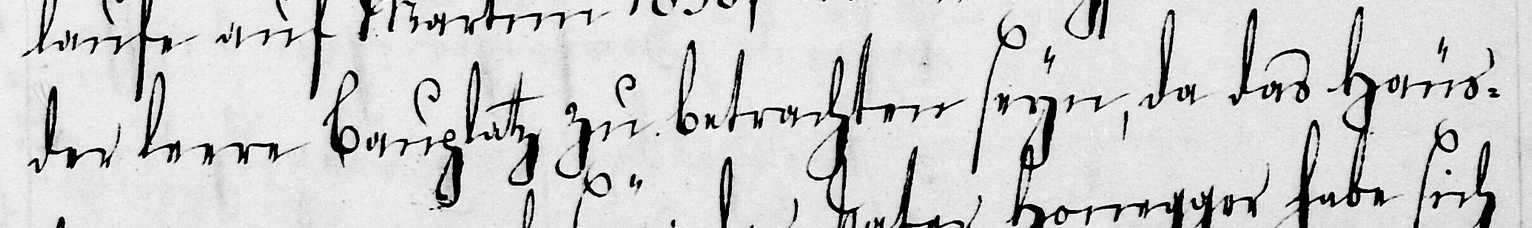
der leere Bauplatz zu betrachten seyn, da das Häus¬
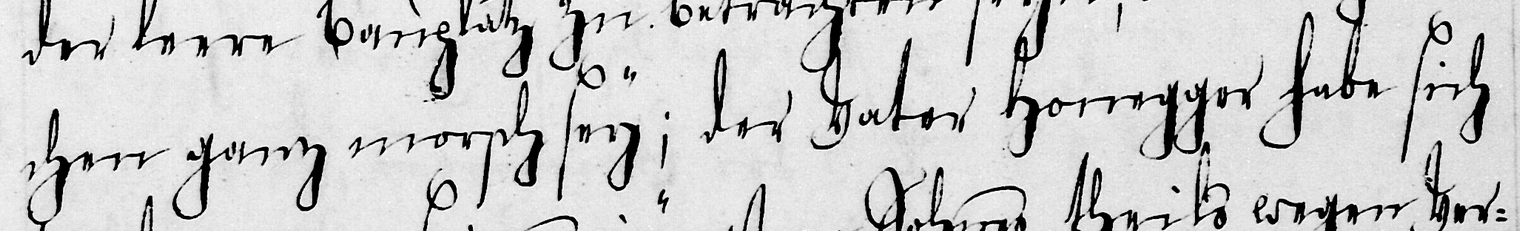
chen ganz morsch sey; der Vater Honegger habe sich
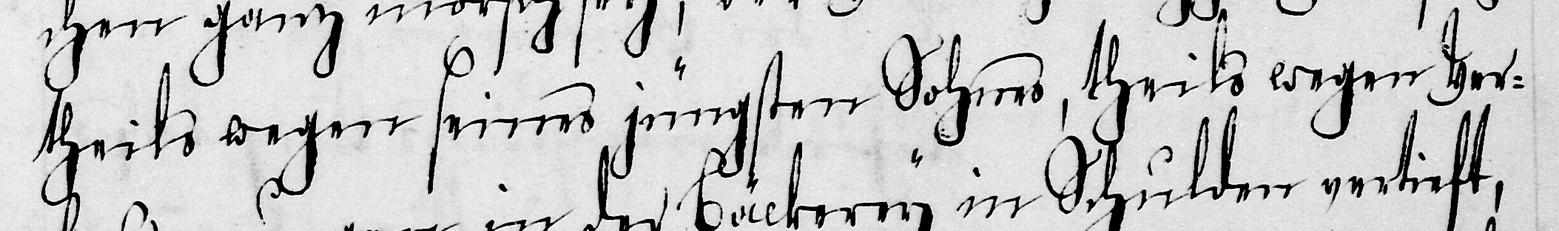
theils wegen seines jüngsten Sohnes, theils wegen Ver¬
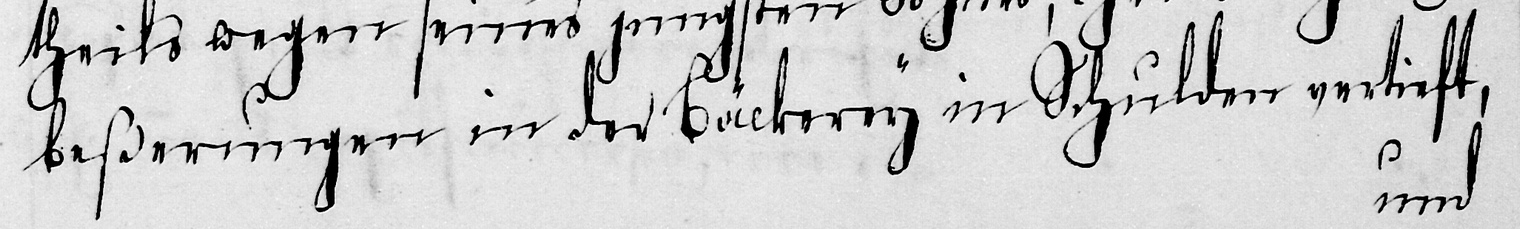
beßerungen in der Bäckerey in Schulden vertieft,
